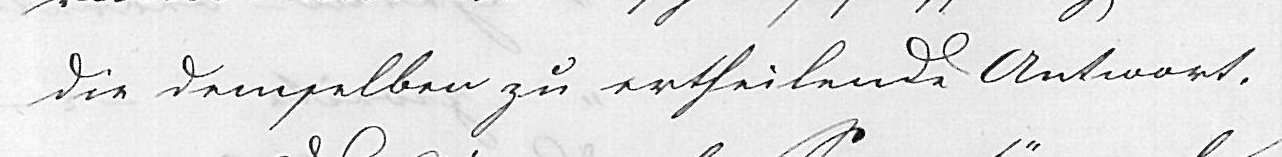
die demselben zu ertheiltende Antwort.
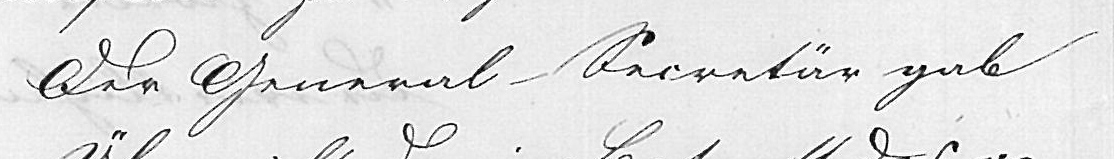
Der General-Secretär gab
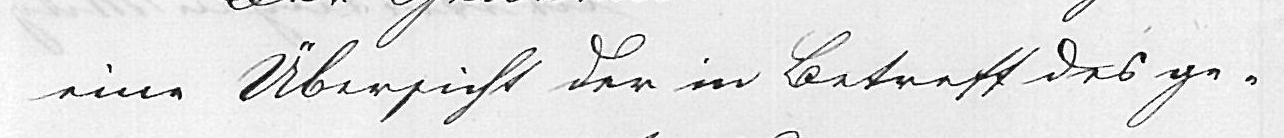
eine Übersicht der in Betreff des ge-
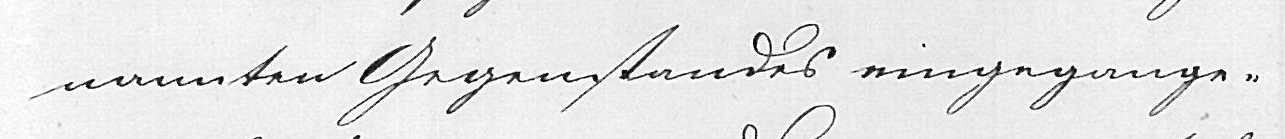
nannten Gegenstands eingegange-
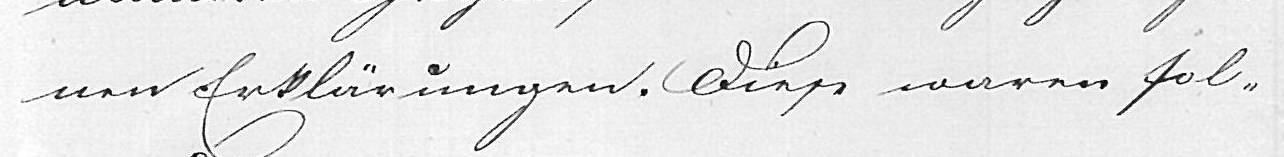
nen Erklärungen. Diese waren fol-
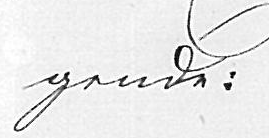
gende:
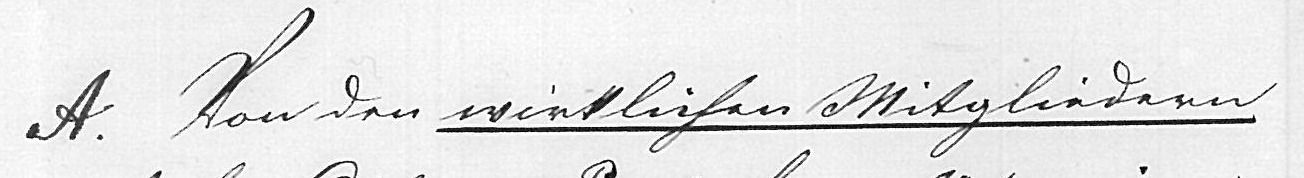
A. Von den wirklichen Mitgliedern
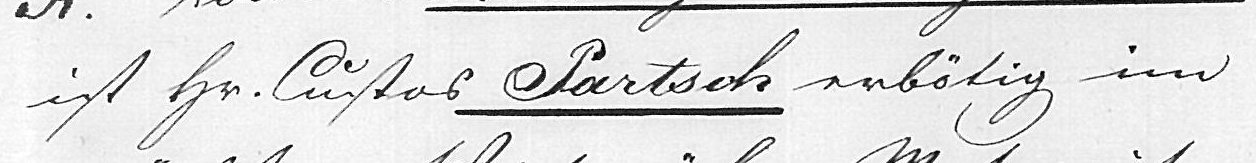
ist Hr. Custos Partsch erbötig im
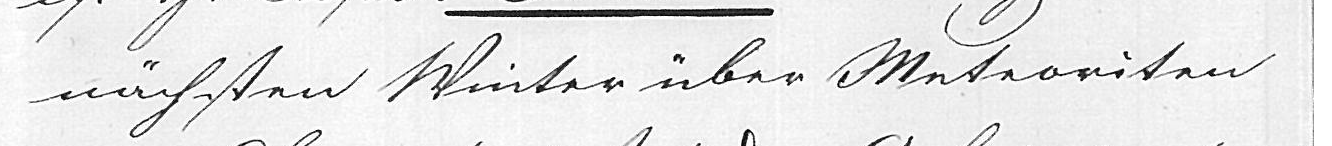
nächsten Winter über Meteoriten
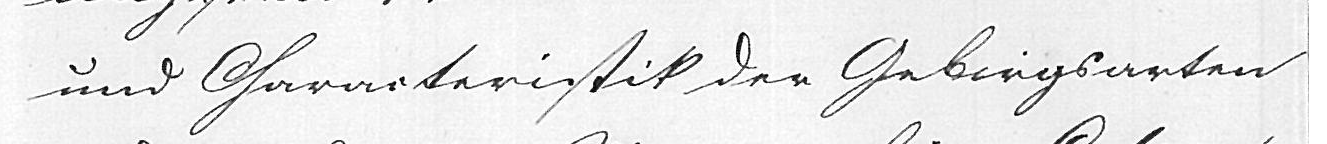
und Characteristik der Gebirgsarten
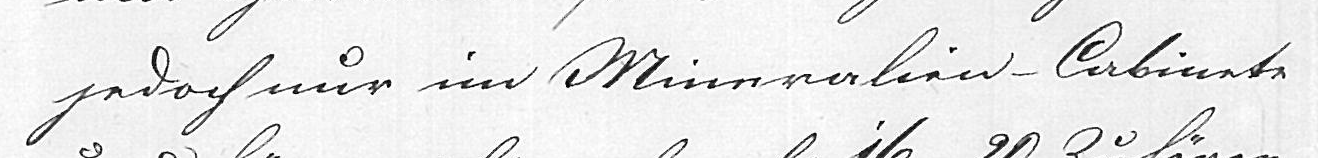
jedoch nur im Mineralien-Cabinete
